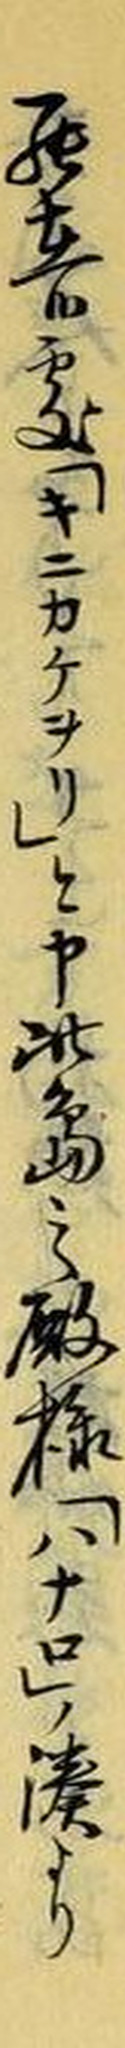罷在候處「キニカケヲリ」と申此島之殿様「ハナロ」ノ湊より
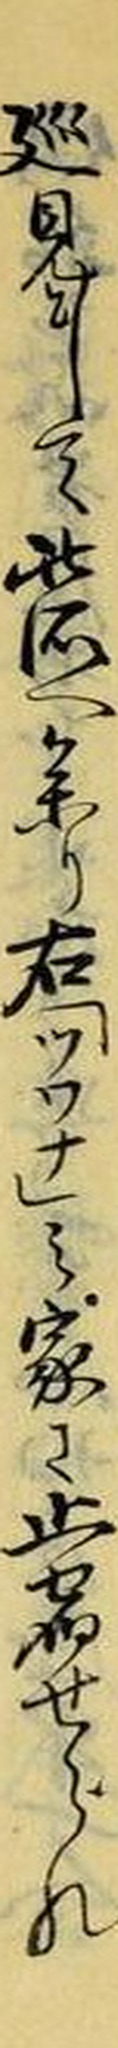巡見として此所へ参り右「ツワナ」之家に止宿せられ
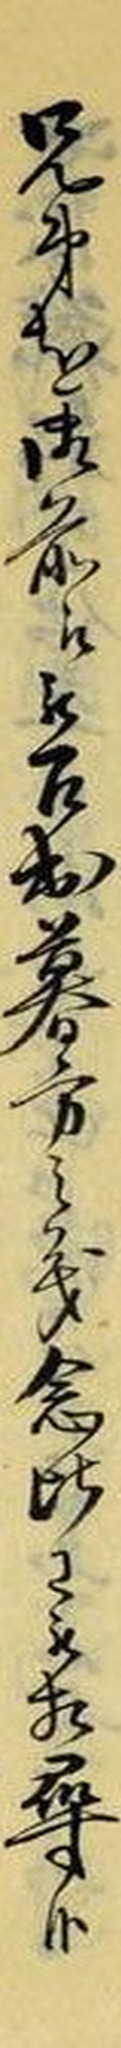兄弟を御前江被召出暮方之義念頃に被相尋候
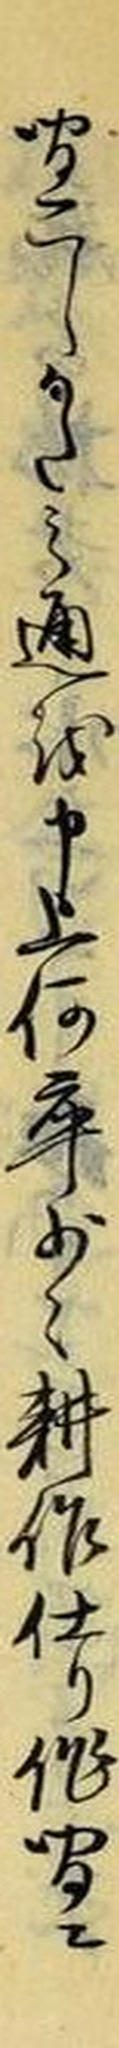間こしかた之通を申上何卒少々耕作仕り作間ニ
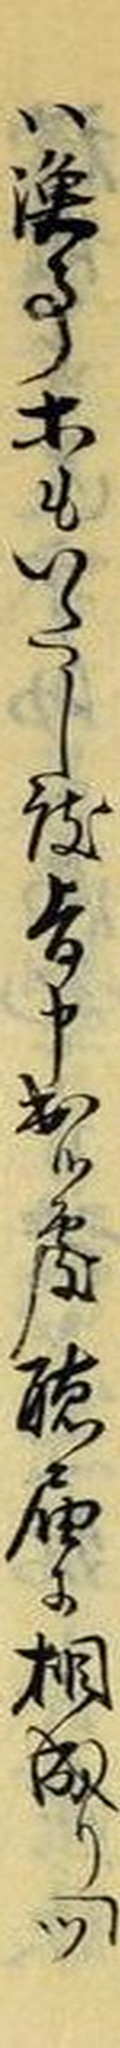ハ漁事等もいたし度旨申出候處聴届に相成り「ツ
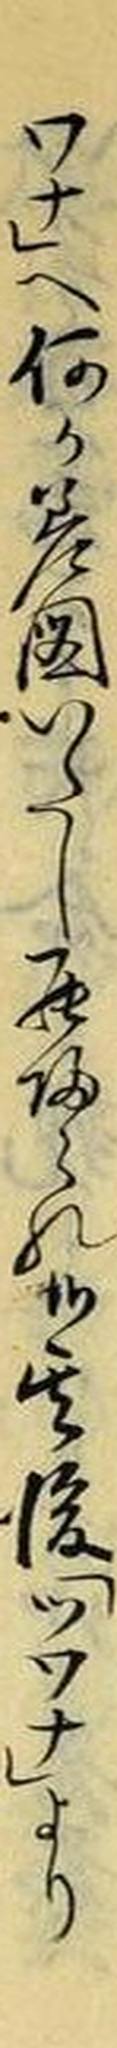ワナ」へ何か指図いたし罷帰られ候其後「ツワナ」より
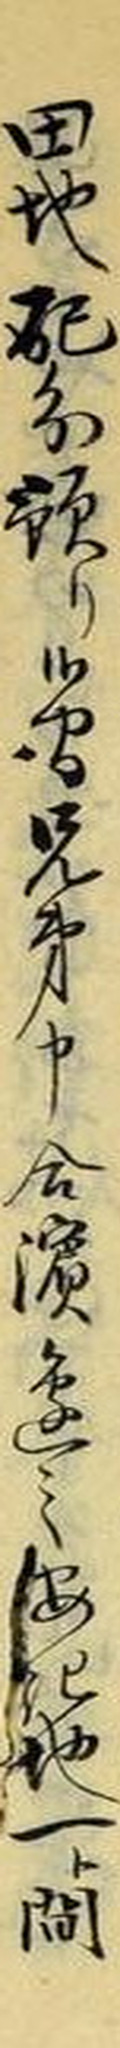田地配分預り候間兄弟申合浜辺之あき地一ト間
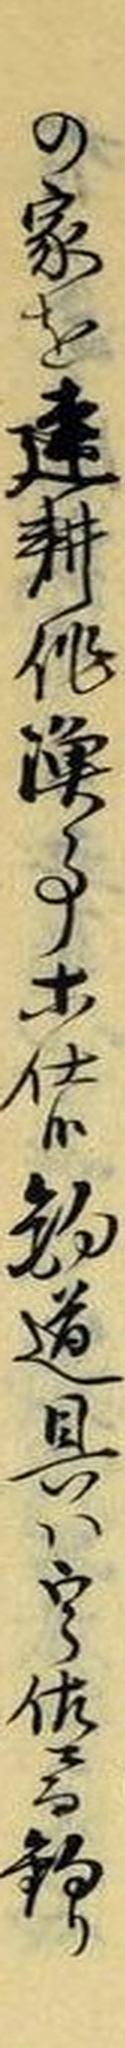の家を建耕作漁事等仕候釣道具ハ宇佐ニ而釣り
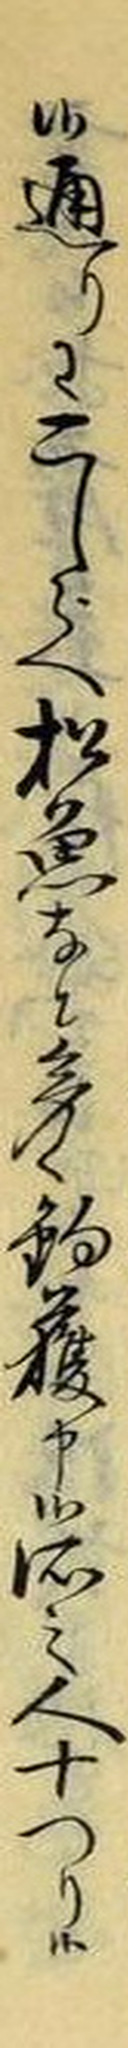候通りにこしらへ松魚なと多く釣獲申候所之人十つり候
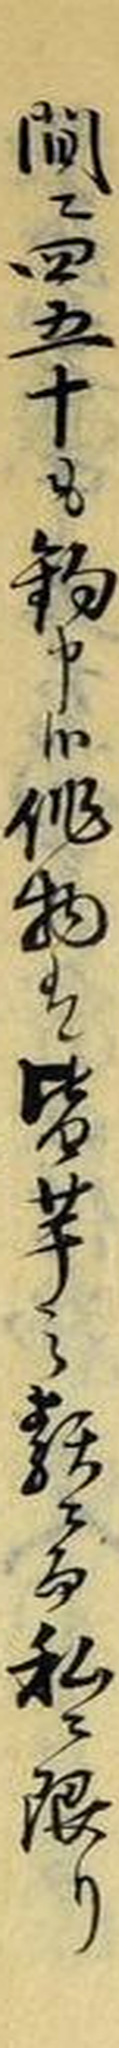間ニ四五十も釣申候作物は皆芋之類ニ而私ニ限り
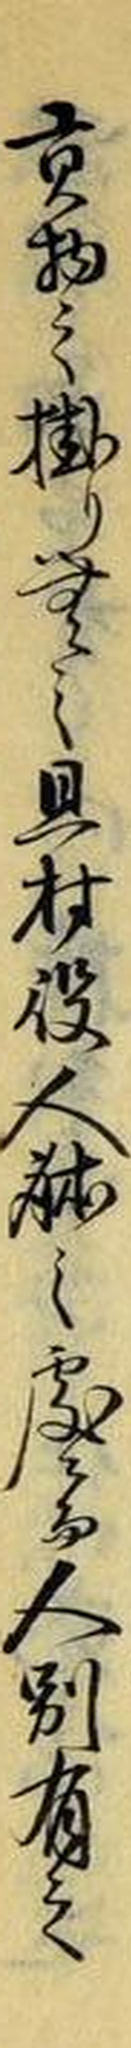貢物之掛り無之且村役人躰之處ニ而人別有之
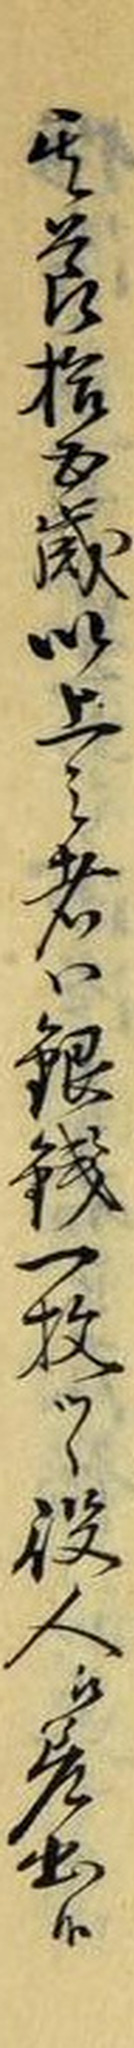其節拾五歳以上之者ハ銀銭一枚ツヽ役人へ差出候

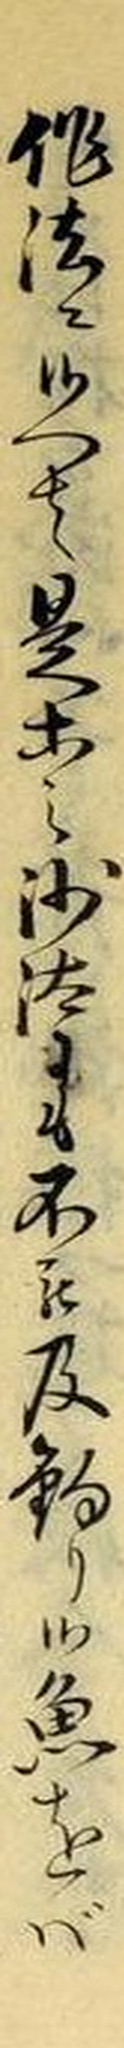作法ニ候へ者是等之沙汰にも不被及釣り候魚をバ
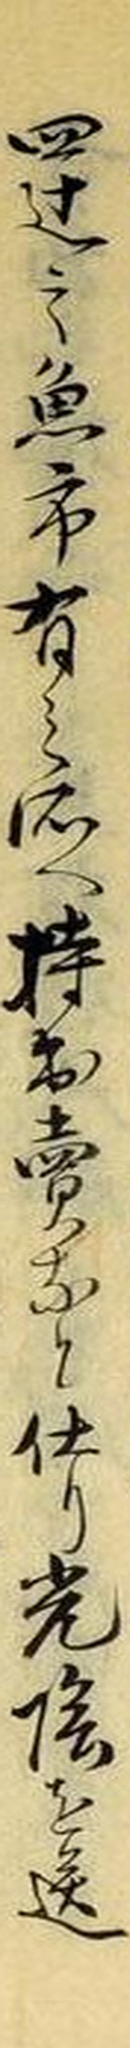四辻之魚市有之所へ持出売なと仕り光陰を送
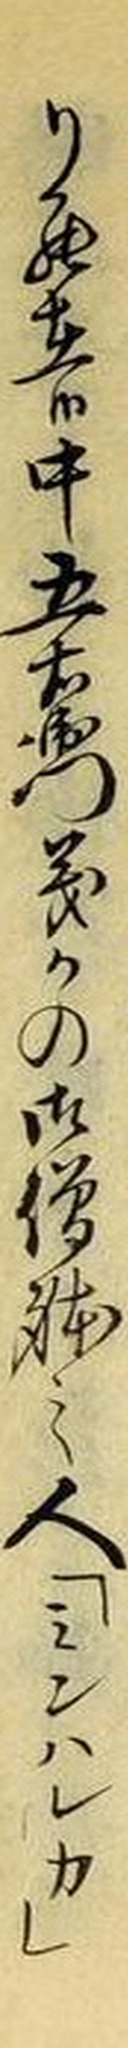り罷在候中五右衛門義かの御僧躰之人「ミンハレカ」
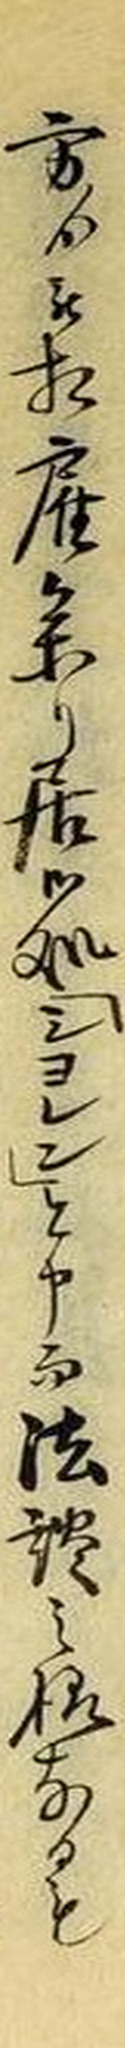方ゟ被相雇参り居候処「シヨレン」と申而法談之様なるも
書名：漂客談奇（備考雑録写8）
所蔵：福井県文書館 Fukui Prefectural Archives
